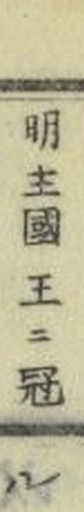明主國王ニ冠
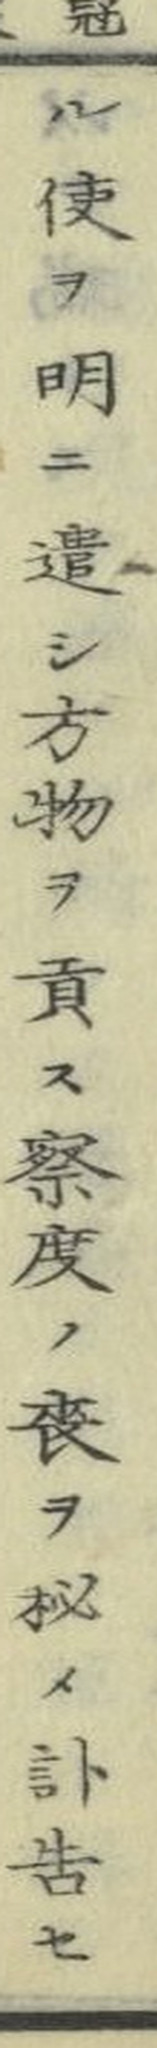ル使ヲ明ニ遣シ方物ヲ貢ス察度ノヲ秘メ訃告セ
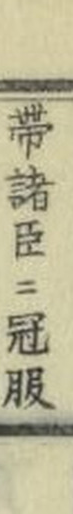帶諸臣ニ冠服
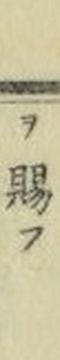ヲ賜フ
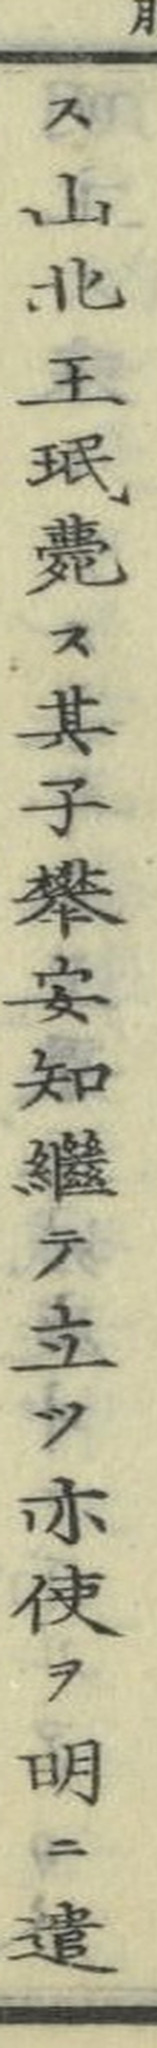ス山北王珉薨ス其子攀安知繼テ立ツ亦使ヲ明ニ遣
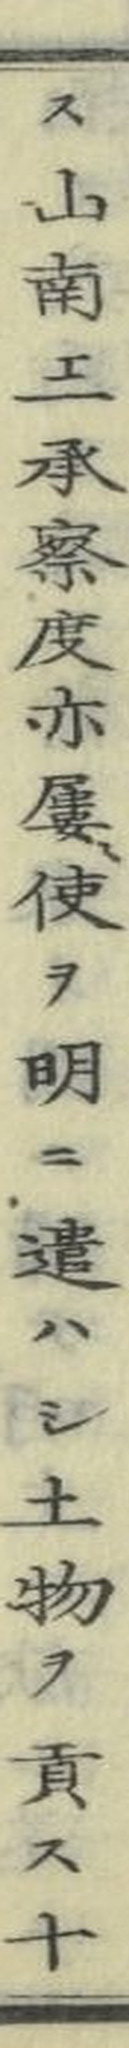ス山南王承察度亦屢〻使ヲ明ニ遣ハシ土物ヲ貢ス十
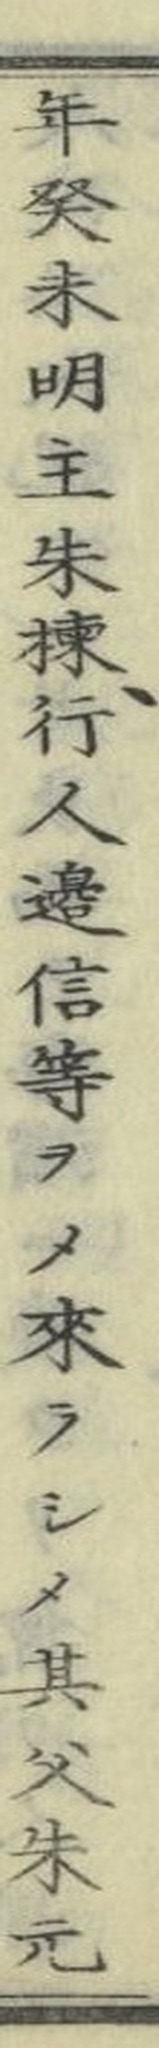年癸未明主朱棟、行人邉信等ヲシテ來ラシメ其父朱元
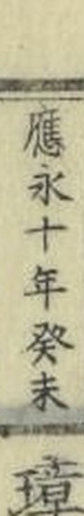應永十年癸未
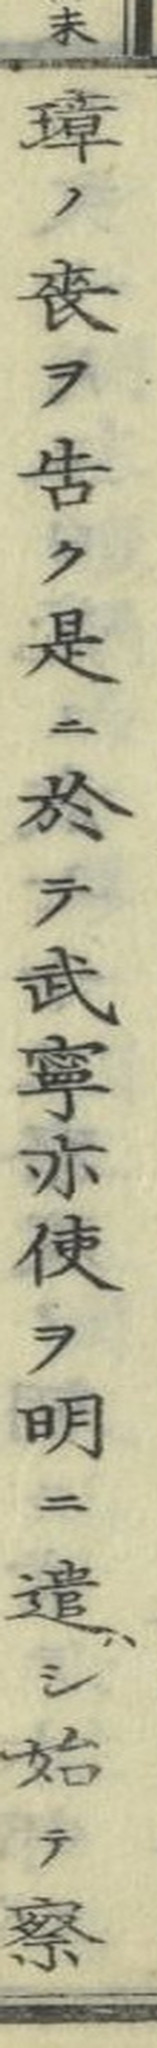璋ノヲ告ク是ニ於テ武寧亦使ヲ明ニ遣シ始テ察
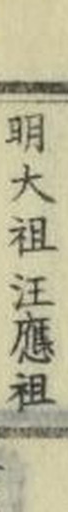明大祖汪應祖
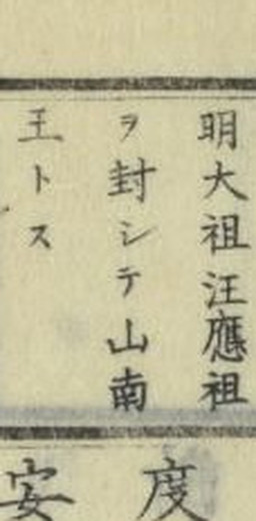ヲ封シテ山南
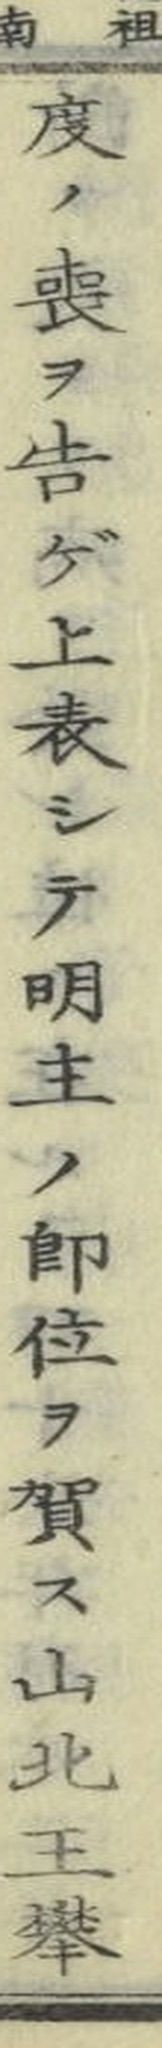度ノ喪ヲ告ゲ上表シテ明主ノ即位ヲ賀ス山北王攀
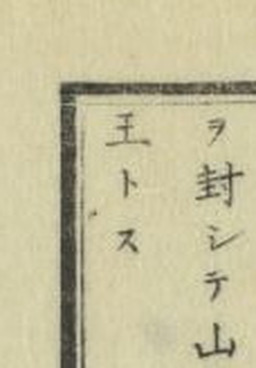王トス
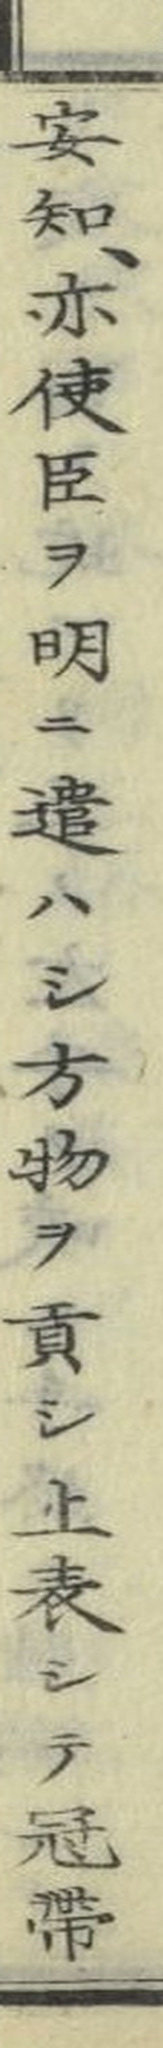安知、亦使臣ヲ明ニ遣ハシ方物ヲ貢シ上表シテ冠帶
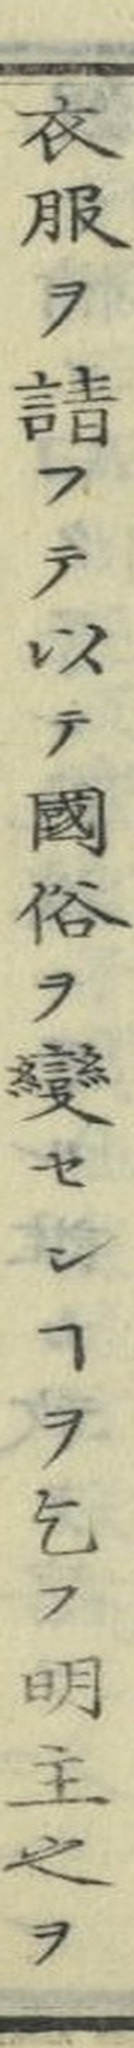衣服ヲ請フテ以テ國俗ヲ變センコトヲ乞フ明主之ヲ
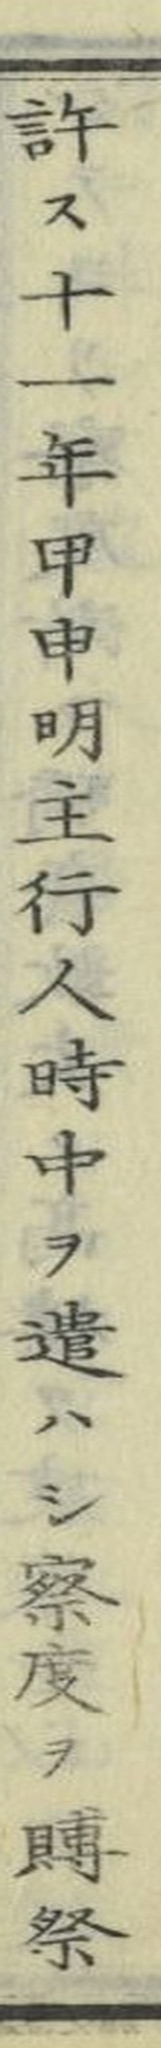許ス十一年甲申明主行人時中ヲ遣ハシ察度ヲ賻祭
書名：琉球藩史 一之巻
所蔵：University of the Ryukyus Library
